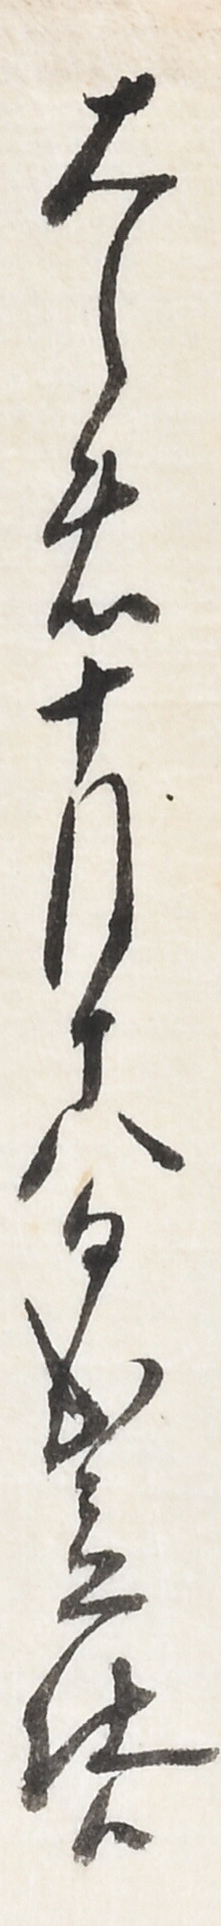右之者十月十八日出立仕候
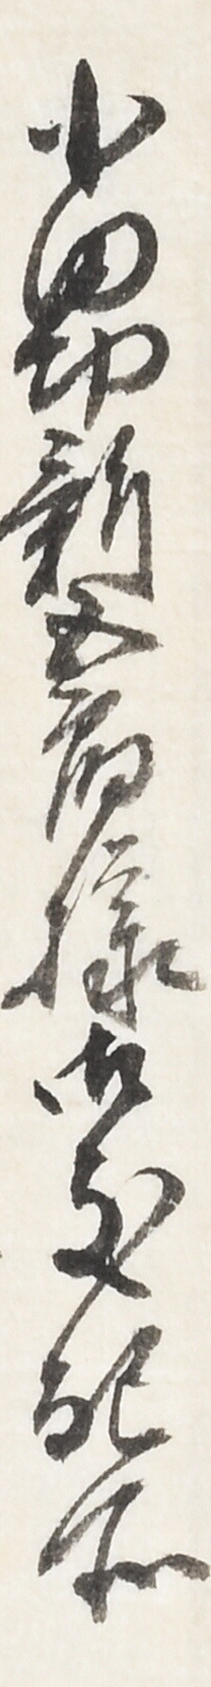小田切新五郎様御支配所
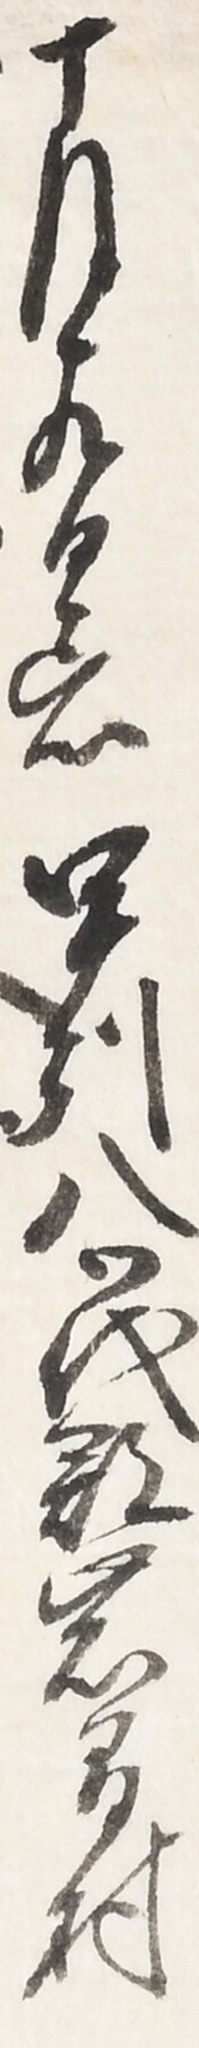十月十九日着甲州八ツ代郡岩間村
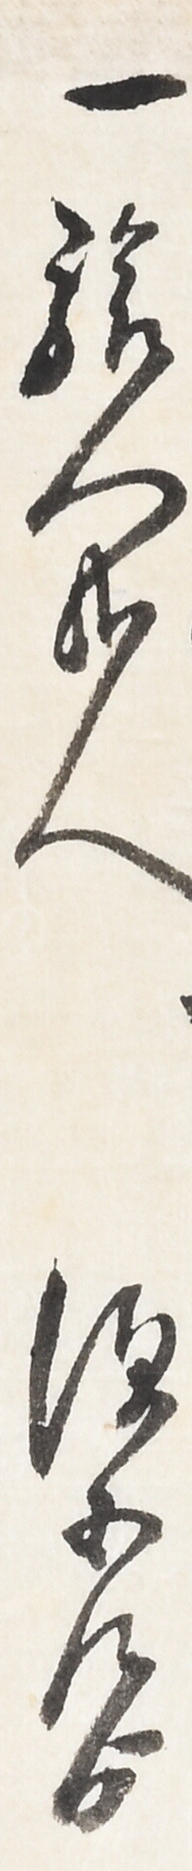一旅人弐人源五左衛門
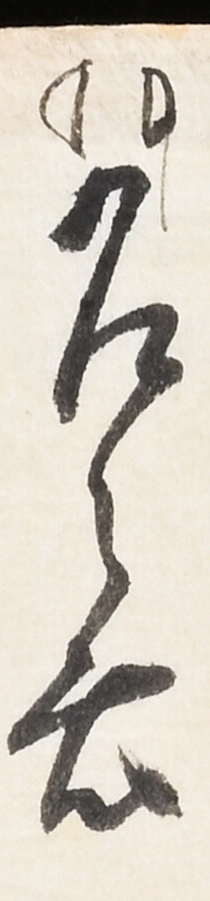右之者
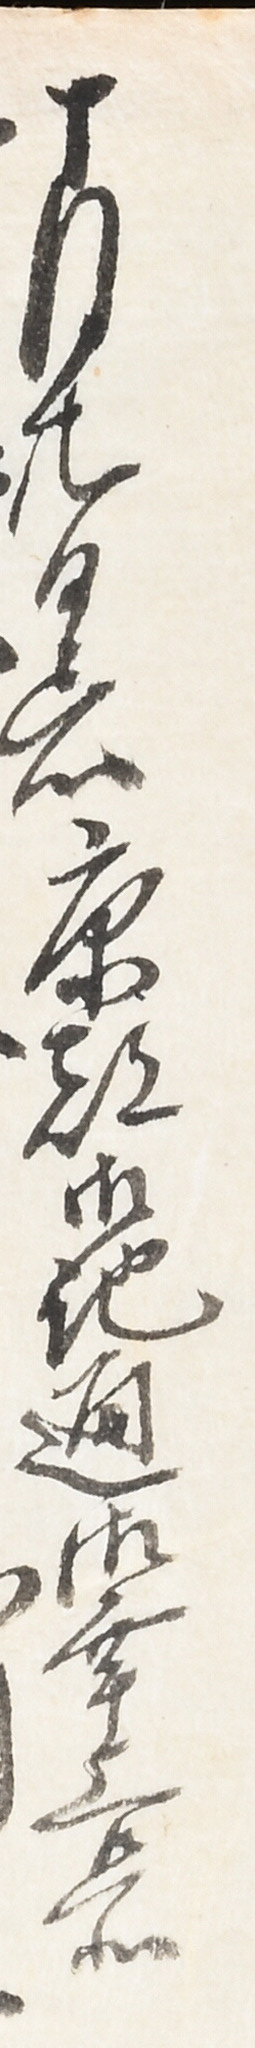十月廿日着京都御池通御幸上ル所
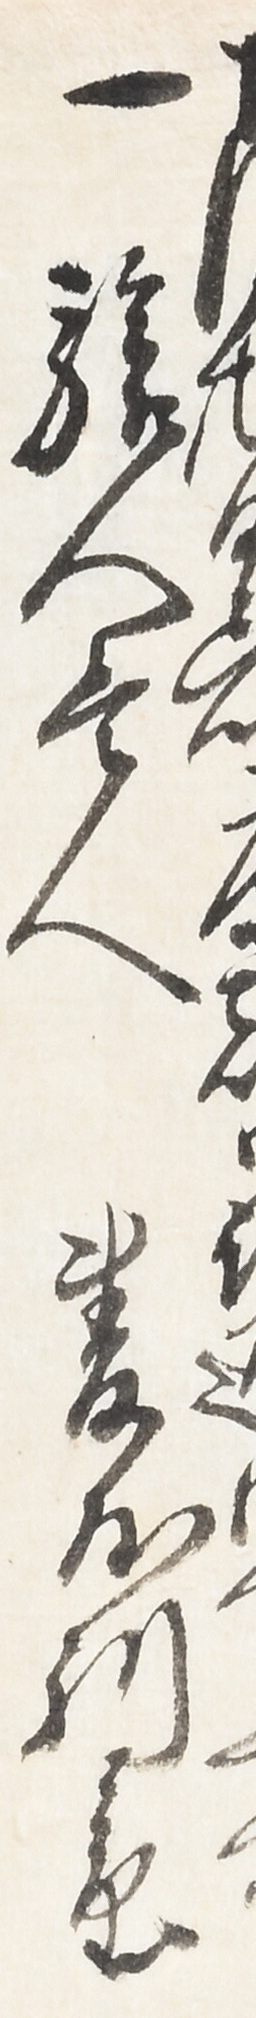一旅人壱人菱屋新兵衛
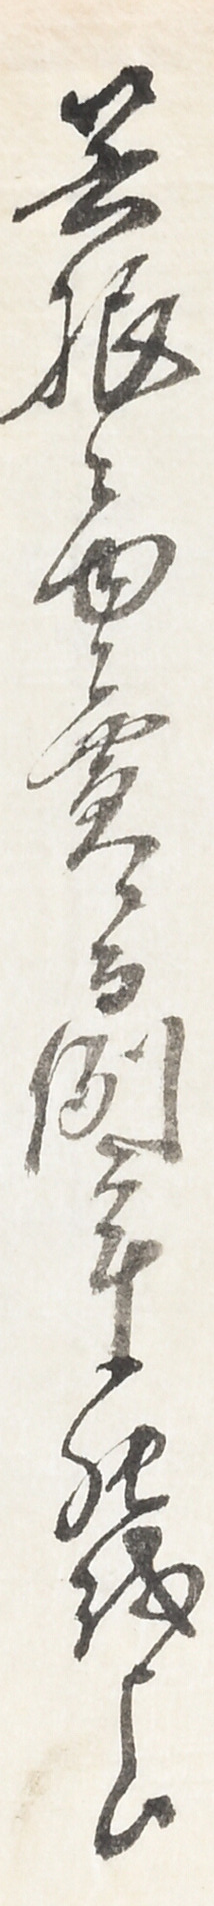呉服商売ニ而例年罷越申候
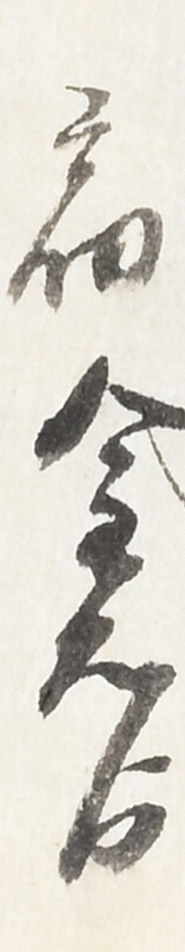宿金右衛門
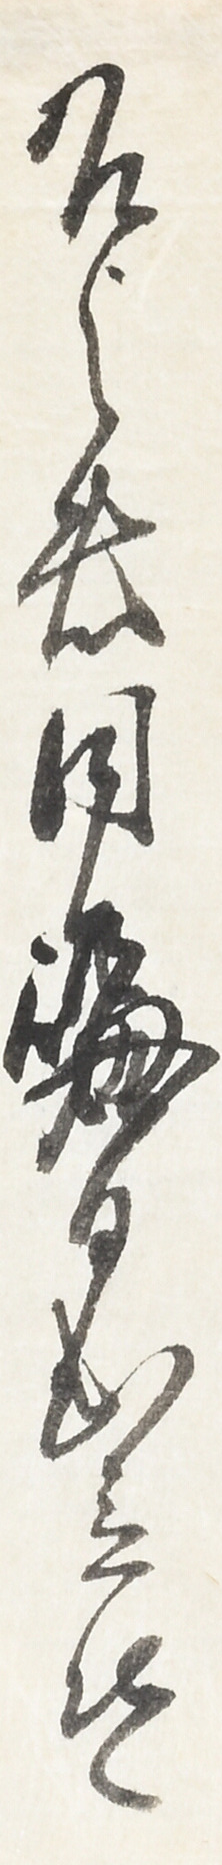右之者同晦日出立仕候
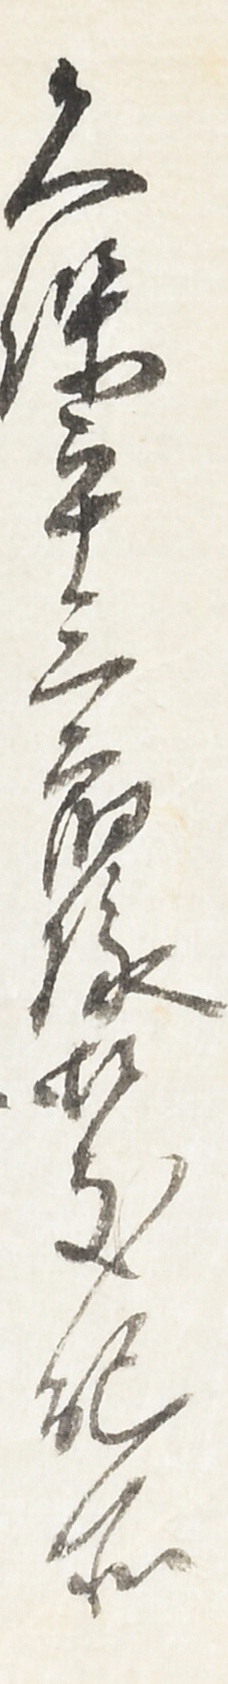久保平三郎様御支配所
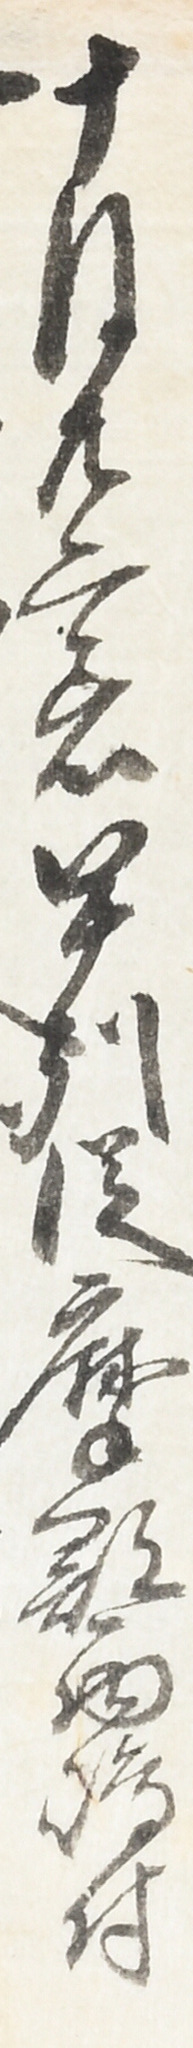十月廿二着甲州巨摩郡西嶋村
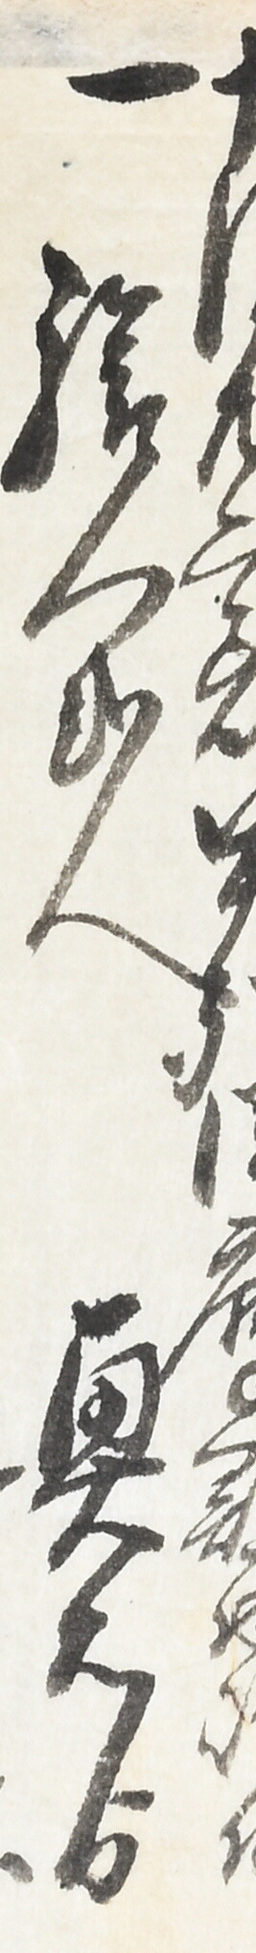一旅人弐人奥右衛門
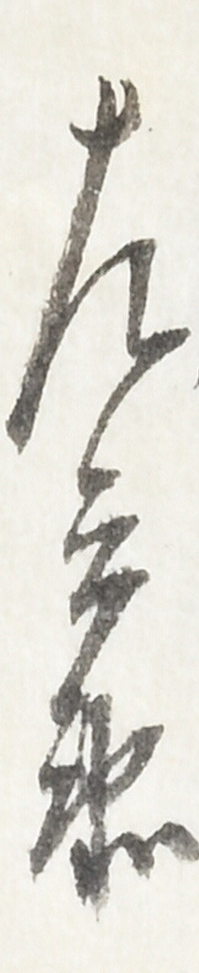左兵衛

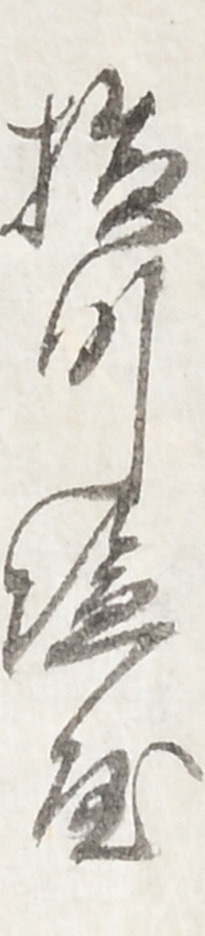横町塩屋
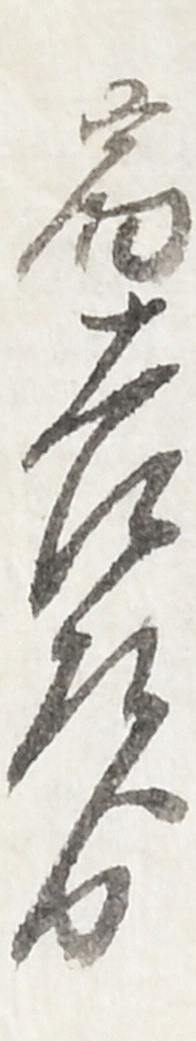宿吉左衛門
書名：旅人泊控帳
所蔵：伊那市立高遠町図書館・合同会社AMANE
